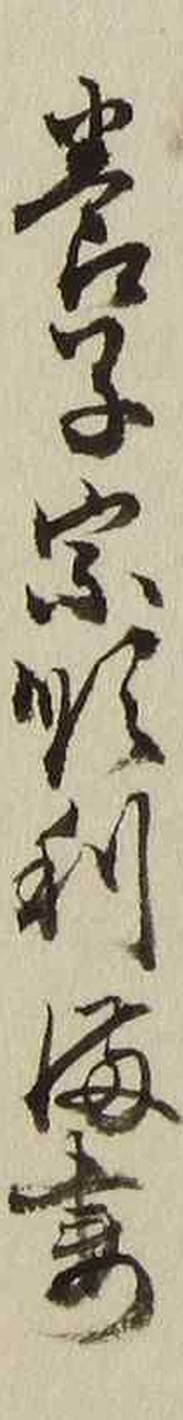女養子宗順利満妻
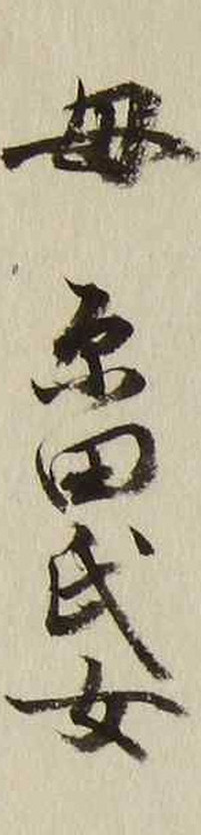母原田氏女

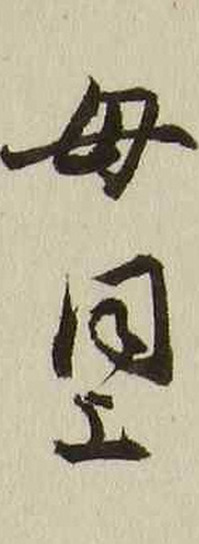母同上
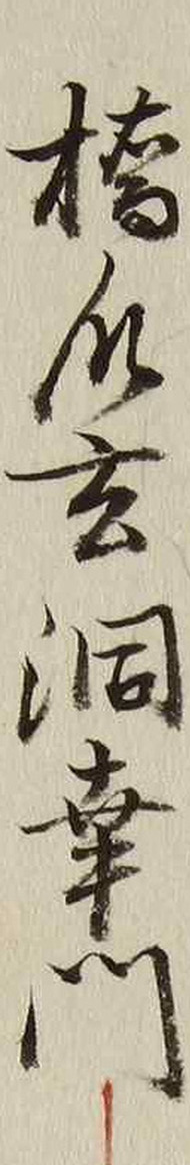橋爪玄洞幸門
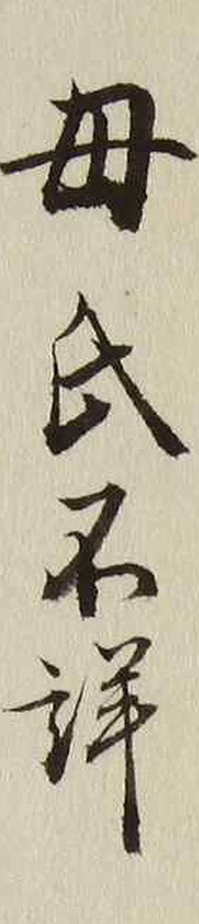母氏不詳
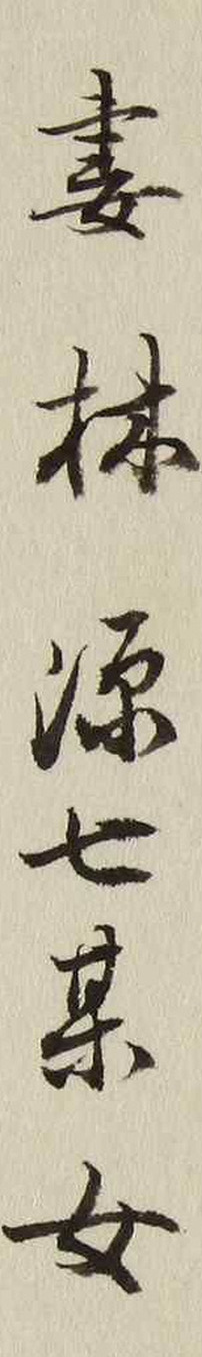妻林源七某女
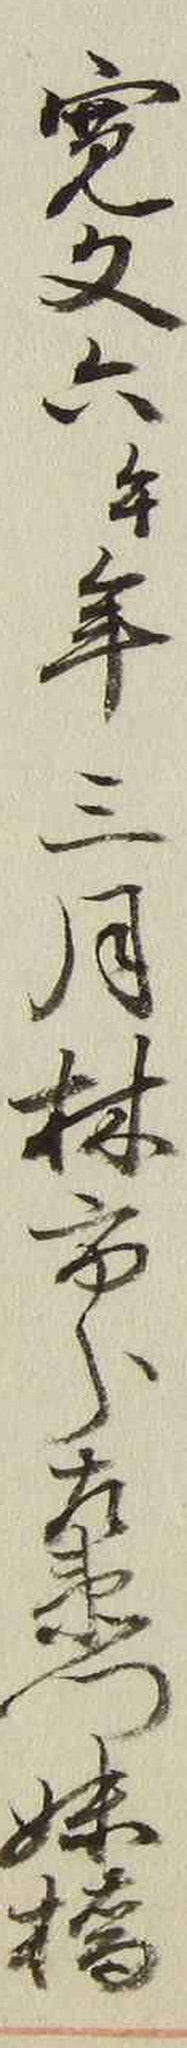寛文六午年三月林市郎左衛門妹橋
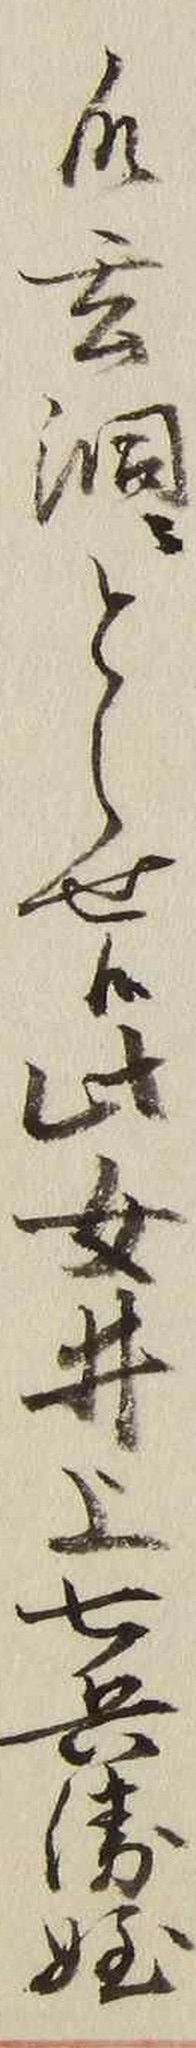爪玄洞ニとらせ候此女井上七兵衛姪

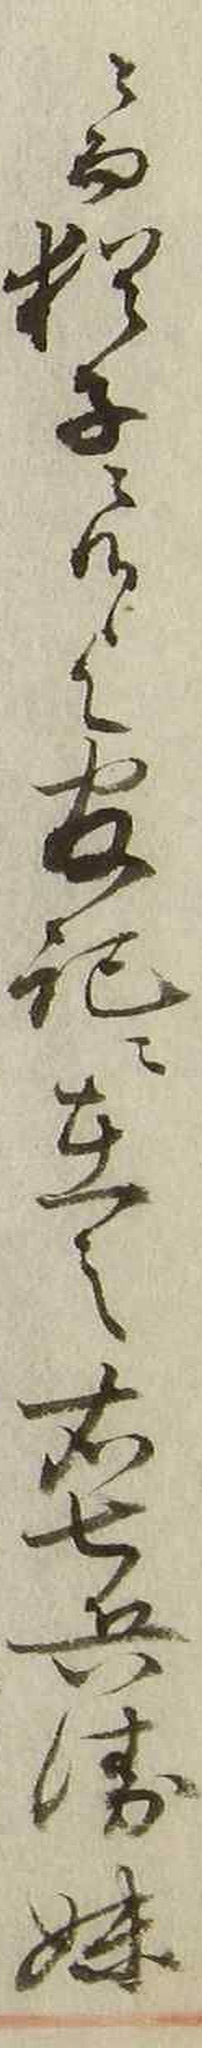ニ而猶子ニ候与官記ニ在之右七兵衛妹
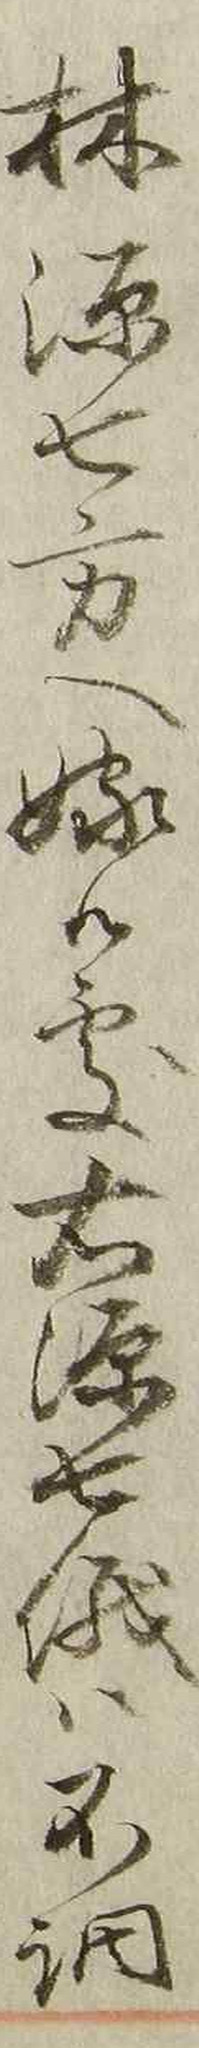林源七方へ嫁候処右源七儀ハ不調
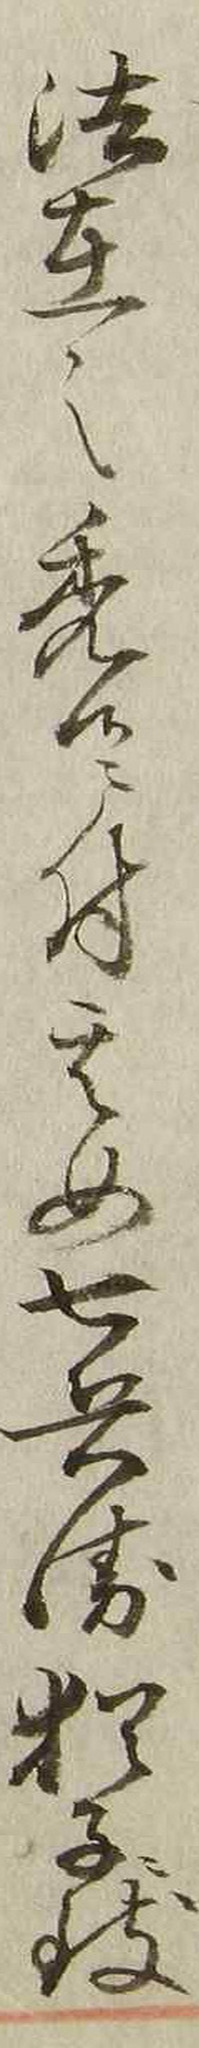法在之禿候ニ付其女七兵衛猶子ニ致
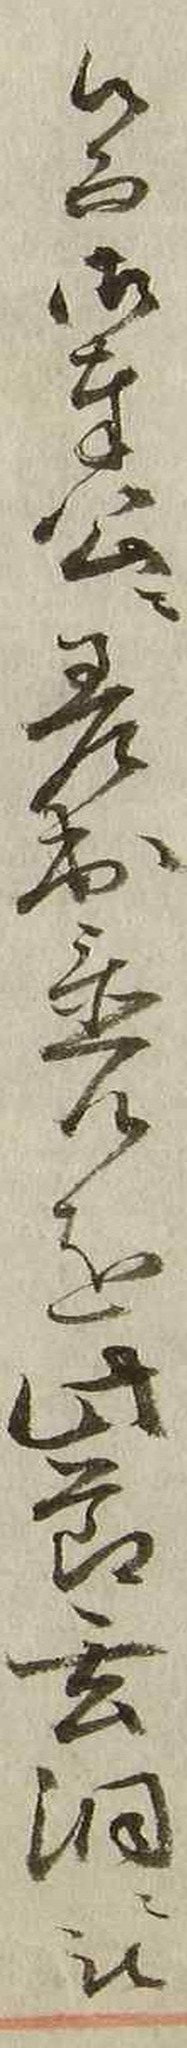候而御奉公ニ差出置候を此節玄洞ニ被
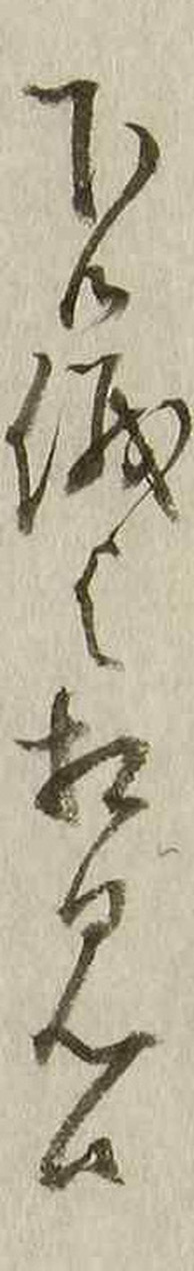下候儀与相見候
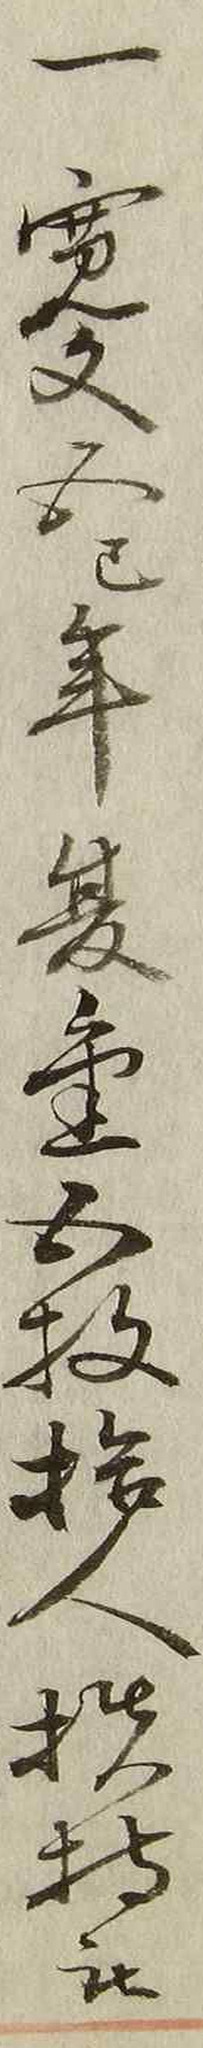一寛文五巳年夏金五枚拾人扶持被
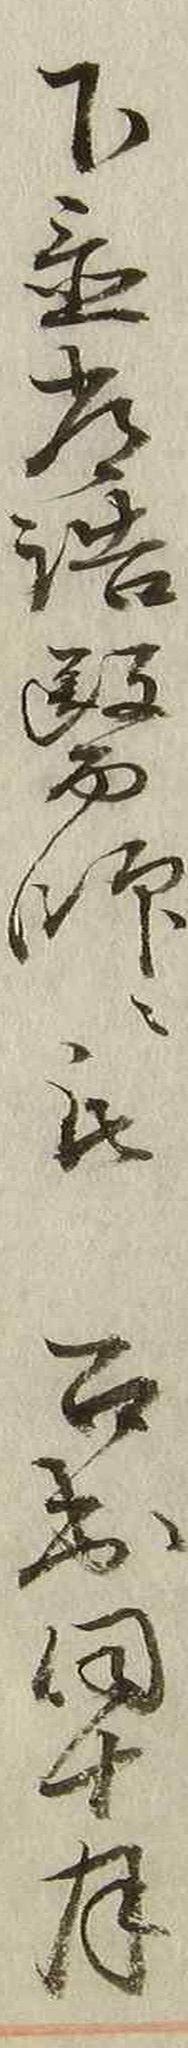下置常詰医師ニ被召出同十月
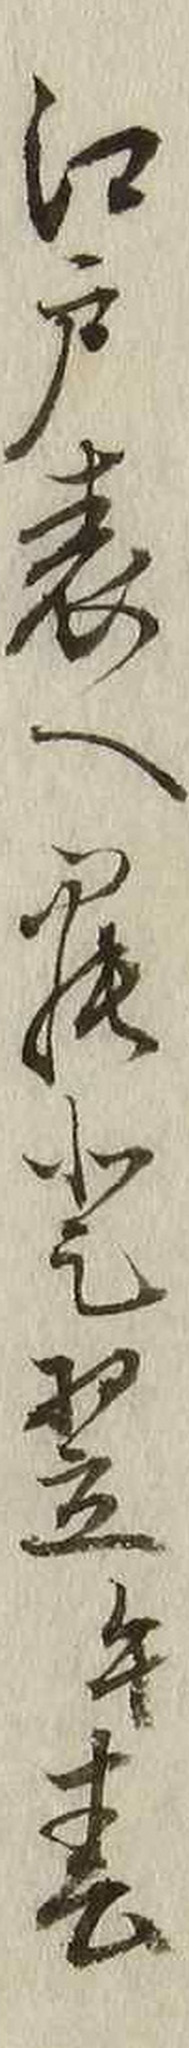江戸表へ罷登翌午春
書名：諸士系譜　巻之39　は之部7
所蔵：会津若松市立会津図書館
